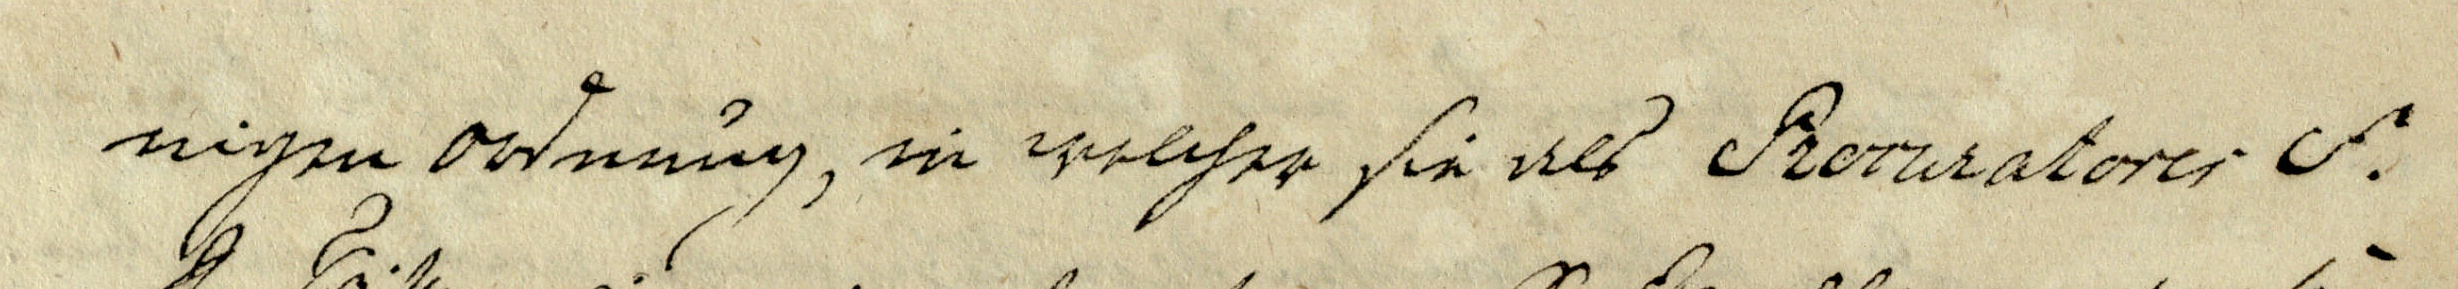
nigen Ordnung, in welcher sie als Procuratores F.
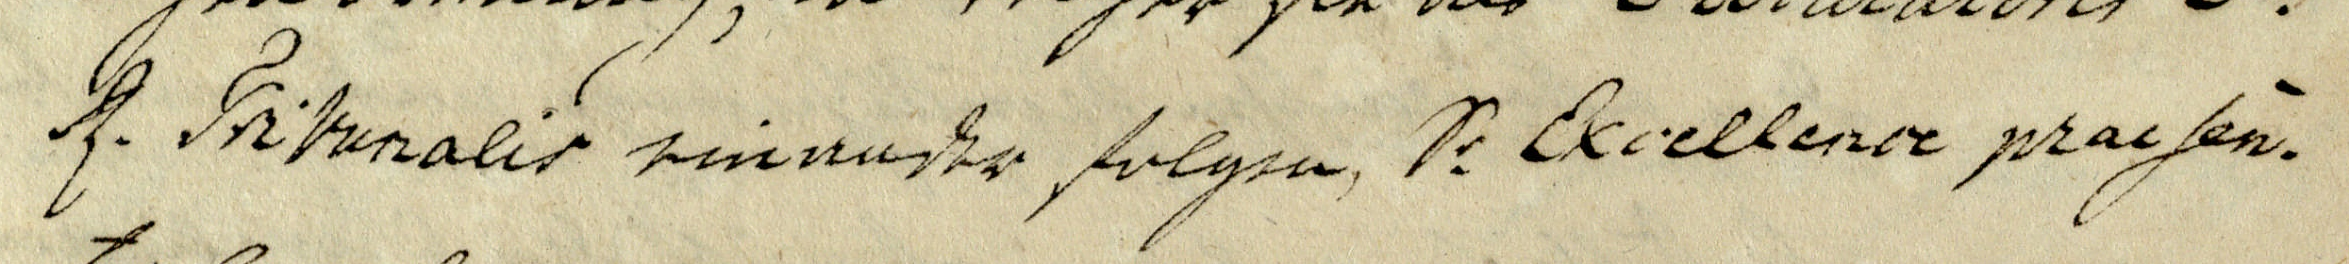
R. Tribunalis einander folgen, Sr Excellence praesen¬
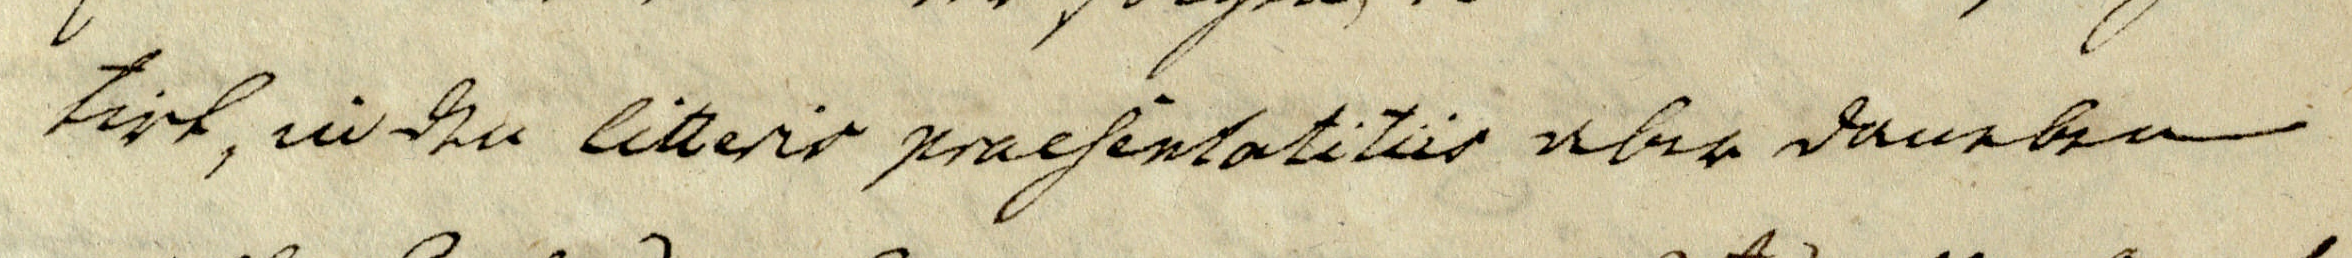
tirt, in den litteris praesentatitiis aber daneben
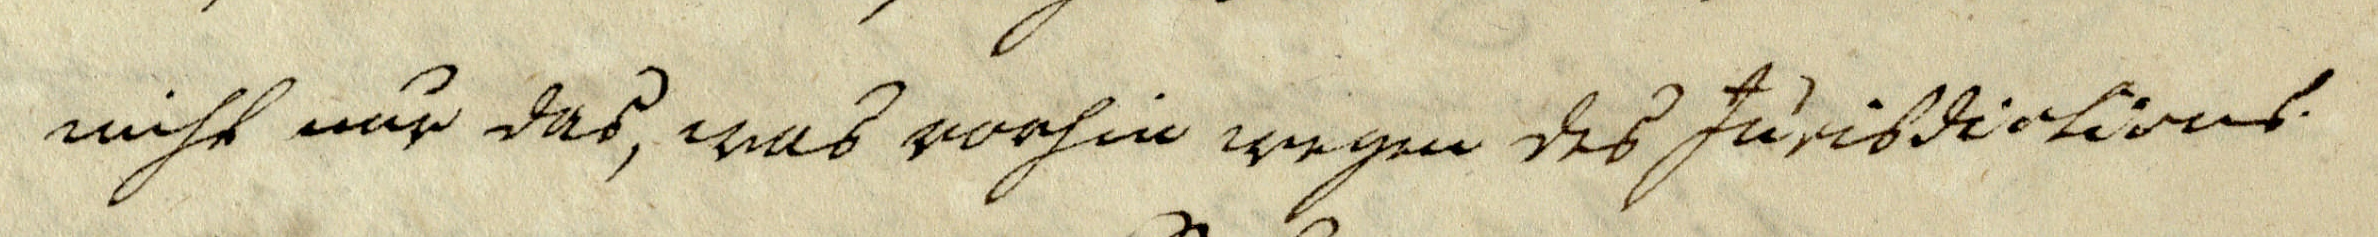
nicht nur das, was vorhin wegen des Jurisdictions-
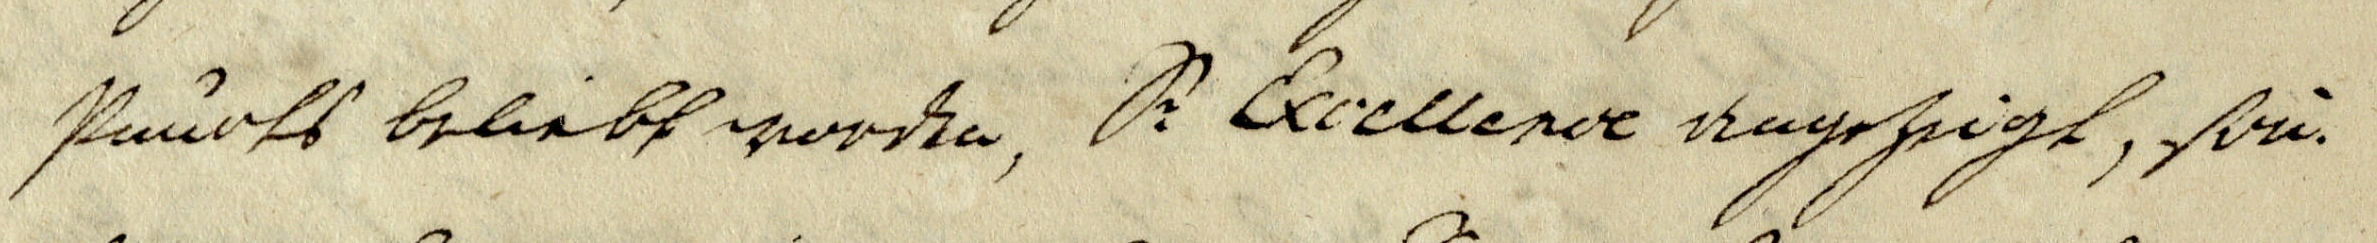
Puncts beliebt worden, Sr Excellence angezeiget, son¬
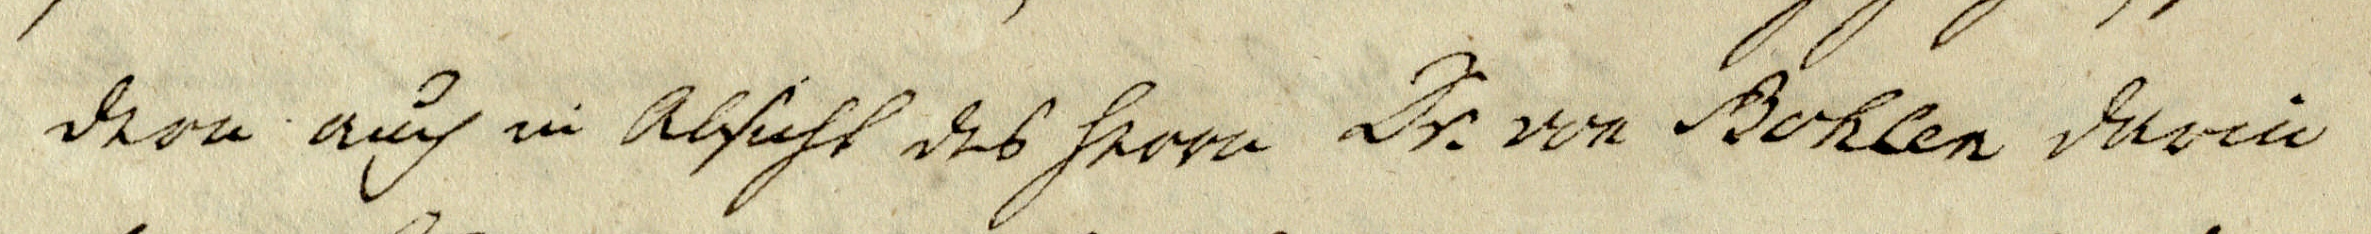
dern auch in Absicht des Herrn Dr. von Bohlen darin
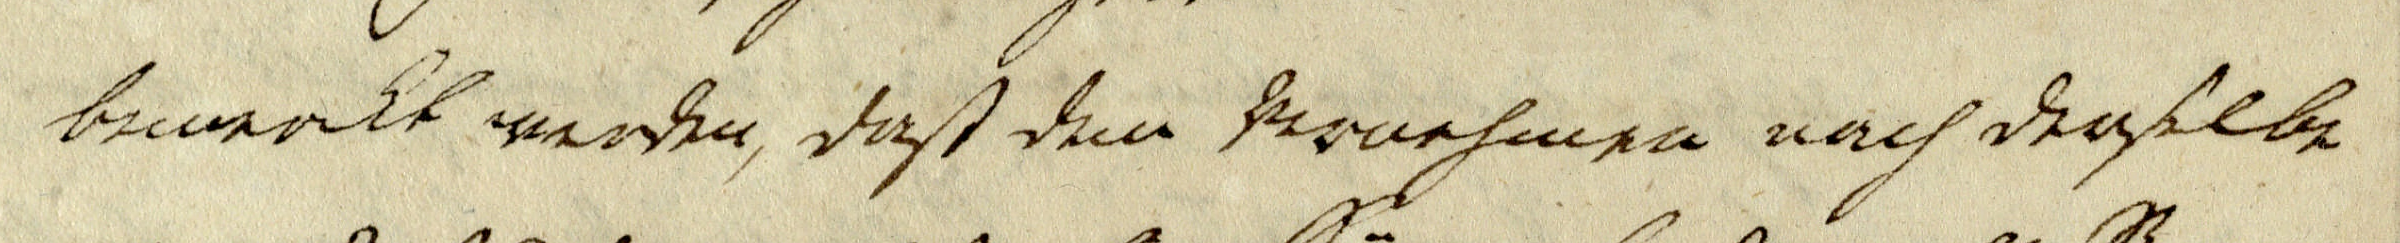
bemerckt werden, daß dem Vernehmen nach derselbe
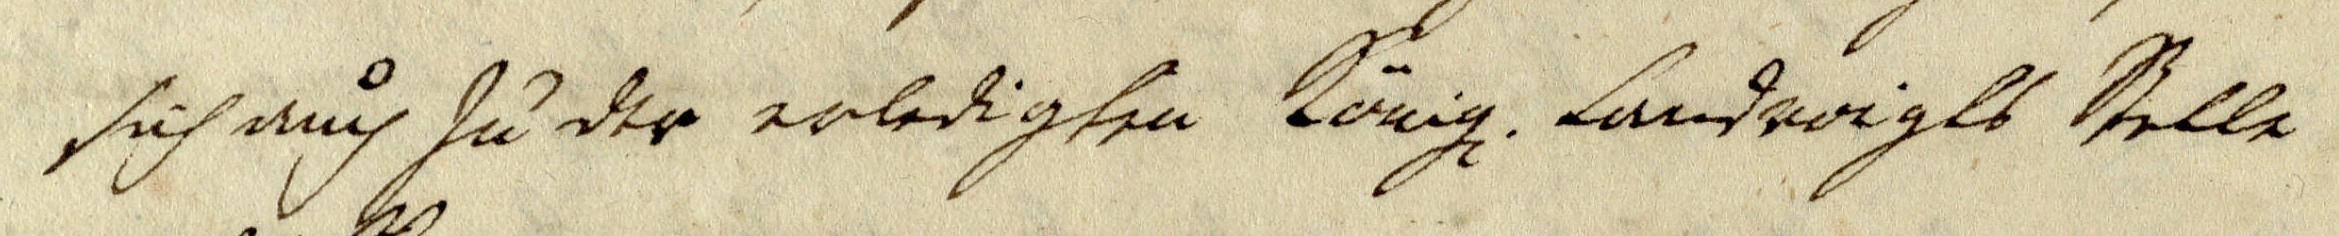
sich auch zu der erledigten König. Landvoigts Stelle
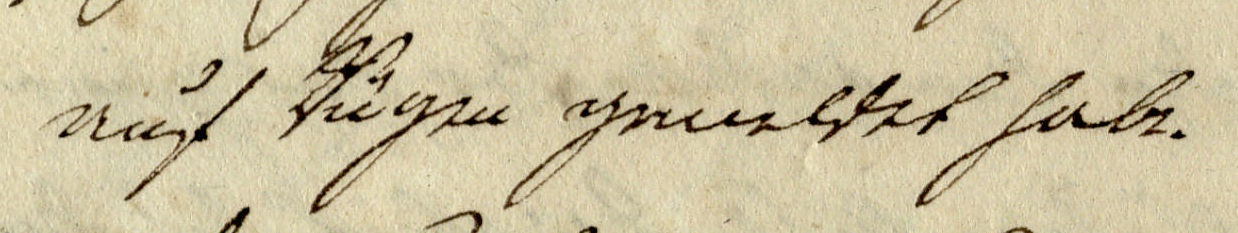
auf Rügen gemeldet habe.
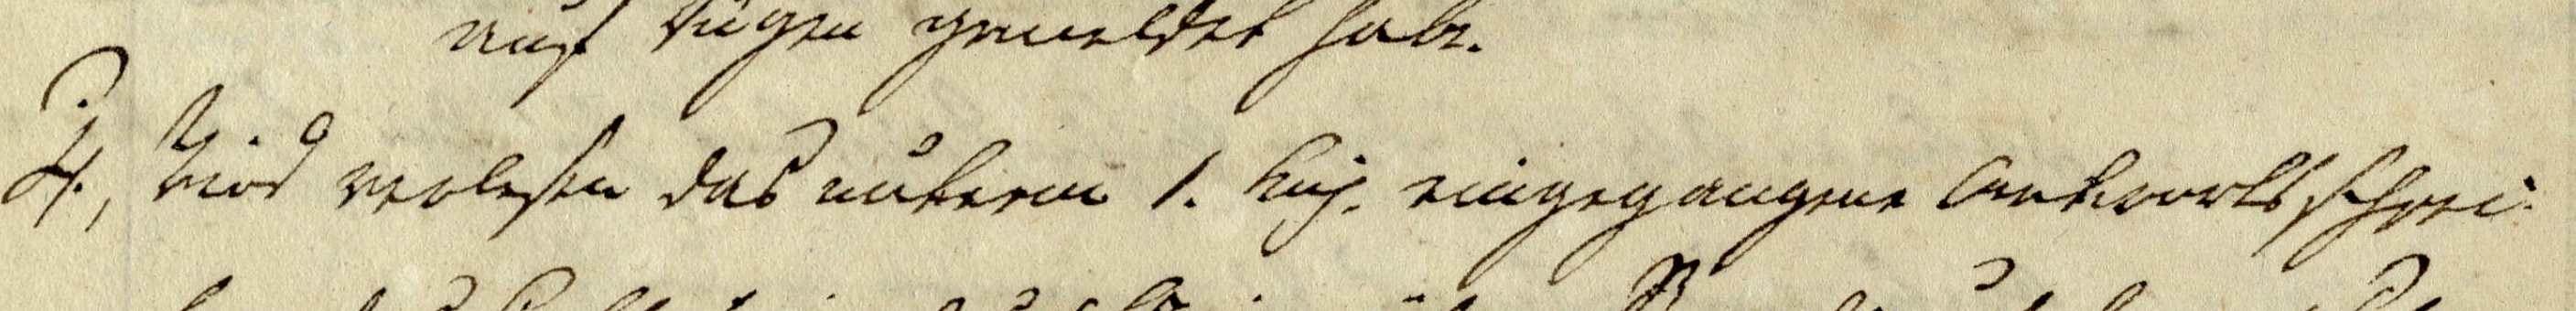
4, Wird verlesen das unterm 1. huj. eingegangene Antwortsschrei¬
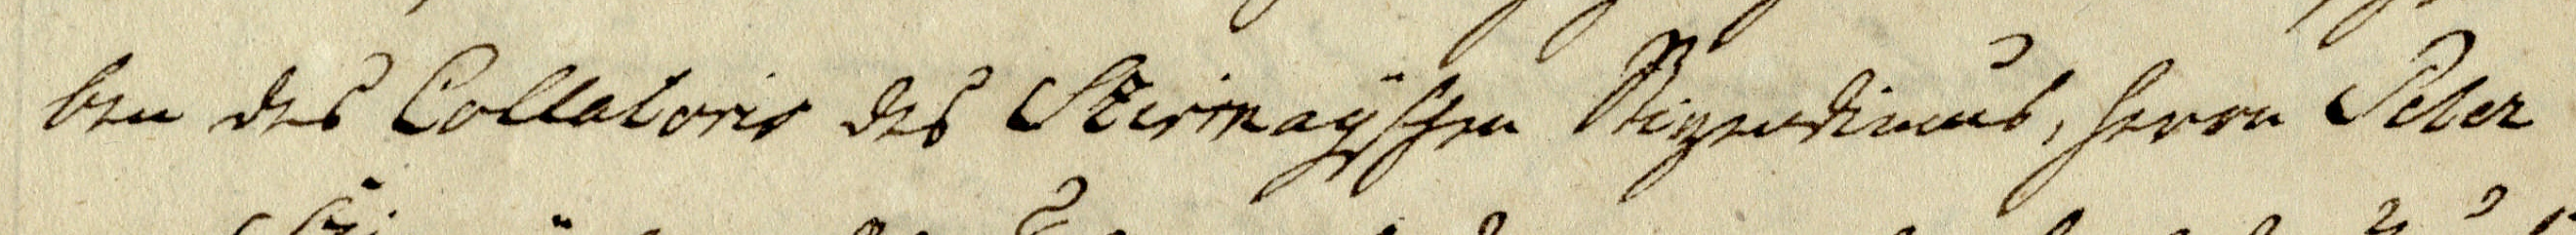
ben des Collatoris des Szirmaÿschen Stipendiums, Herrn Peter
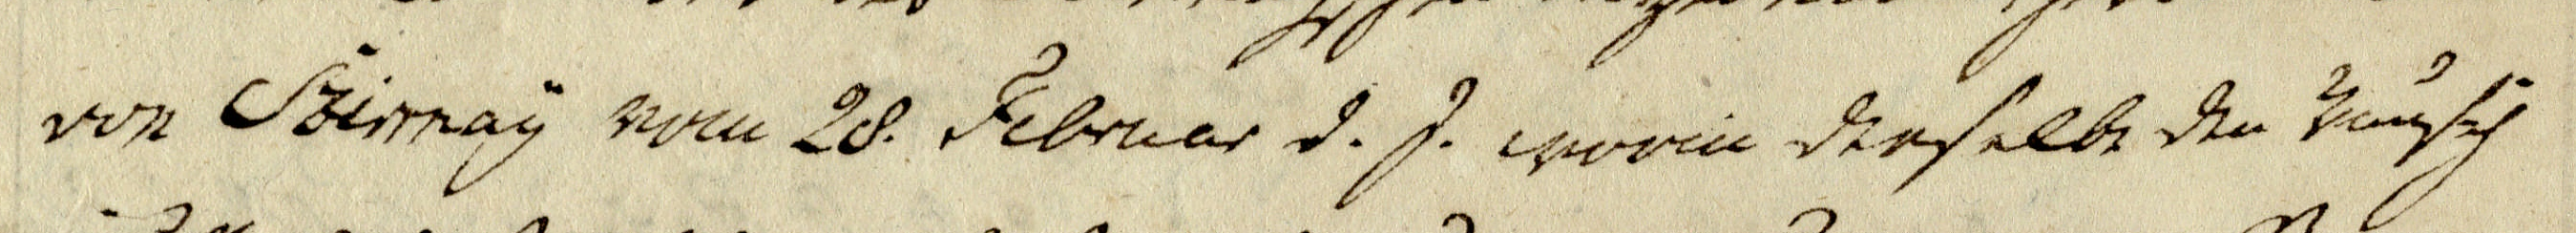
von Szirmaÿ vom 28. Februar d. J. worin derselbe den Wunsch
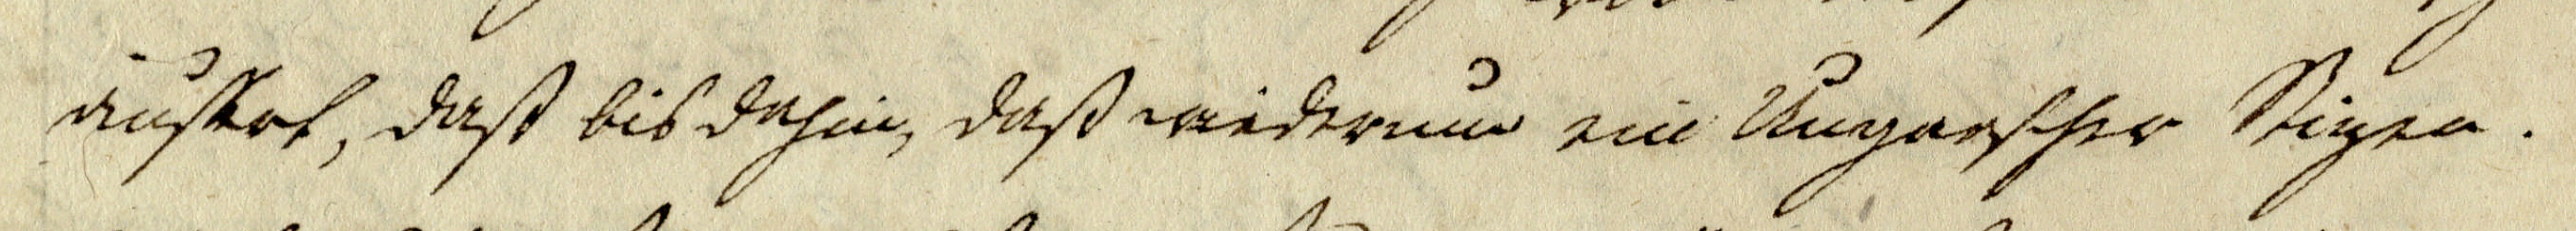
äussert, daß bis dahin, daß wiederum ein Ungarscher Stipen¬
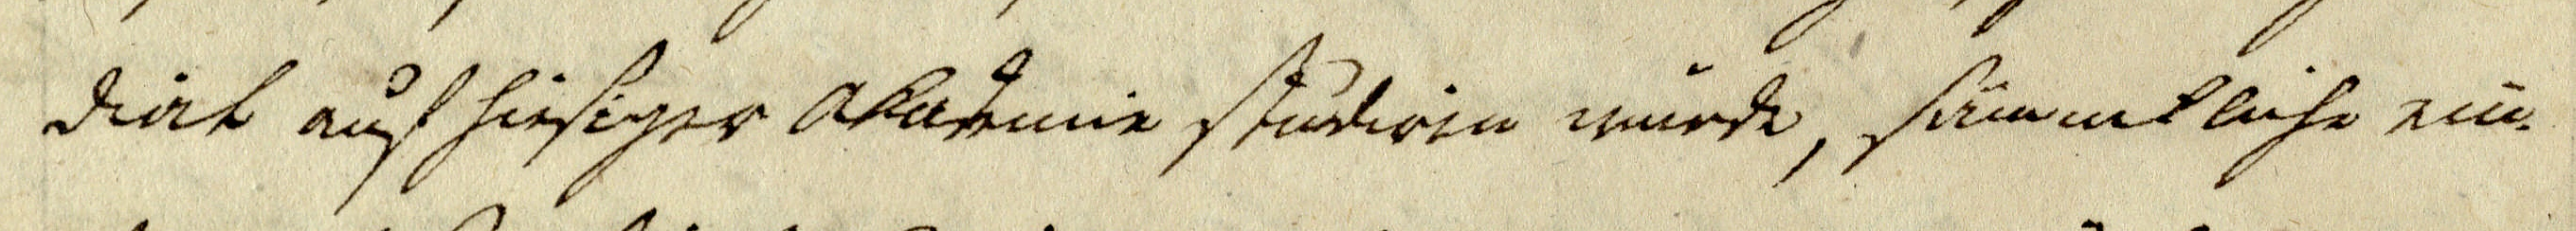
diat auf hiesiger Akademie studiren würde, sämmtliche ein¬
